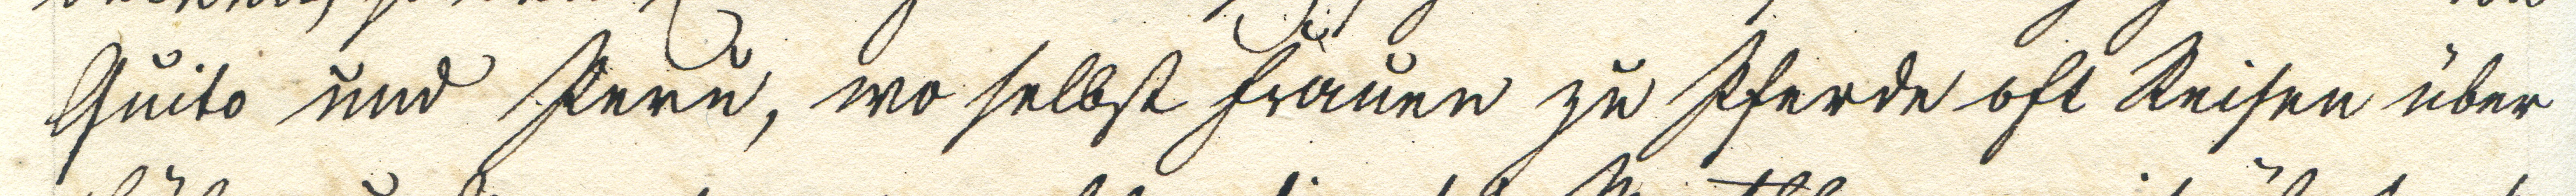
Quito und Peru, wo selbst Frauen zu Pferde oft Reisen über
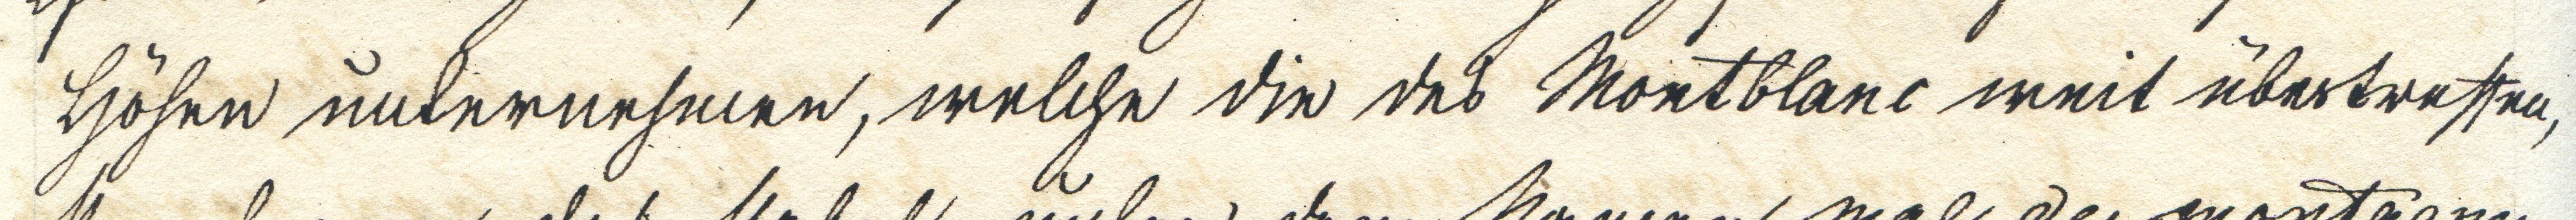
Höhen unternehmen, welche die des Montblanc weit übertreffen,
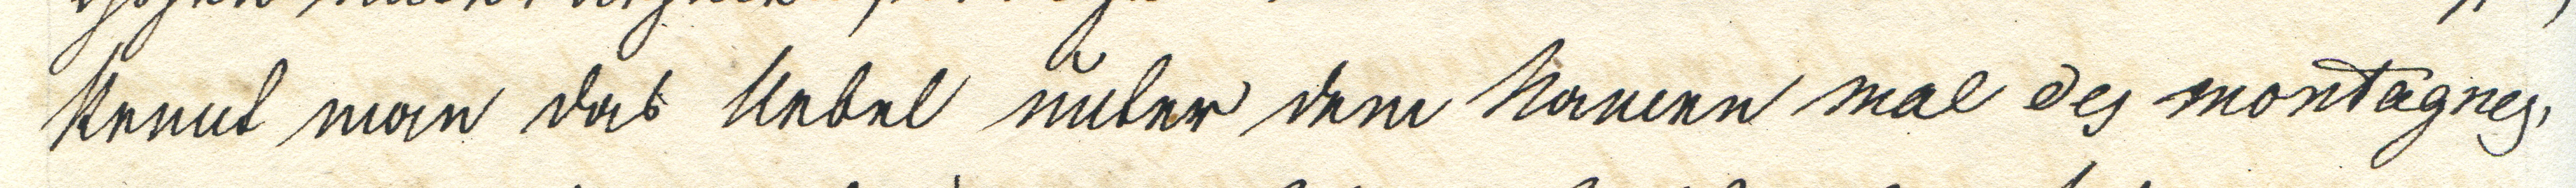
kennt man das Uebel unter dem Namen mal des montagnes,
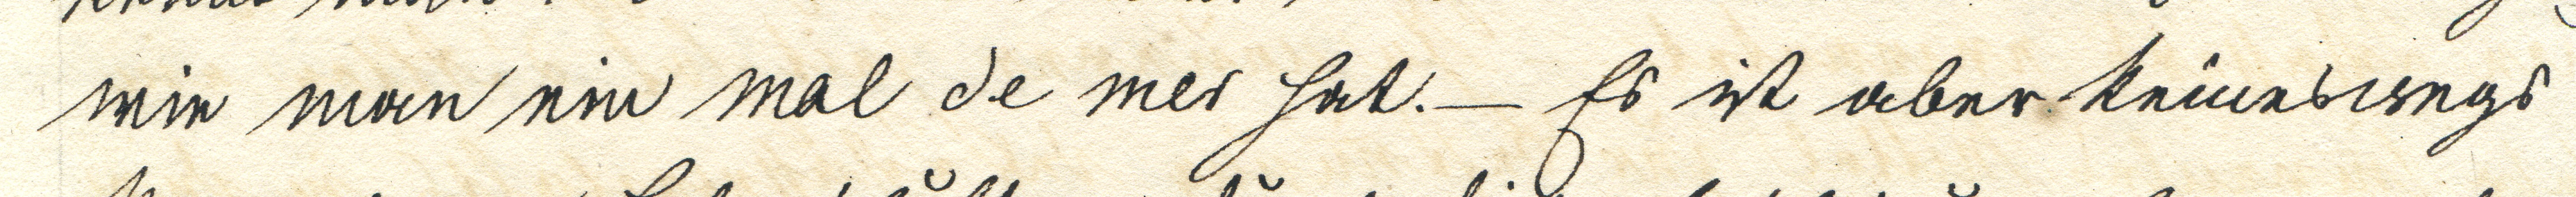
wie man ein mal de mer hat. – Es ist aber keineswegs
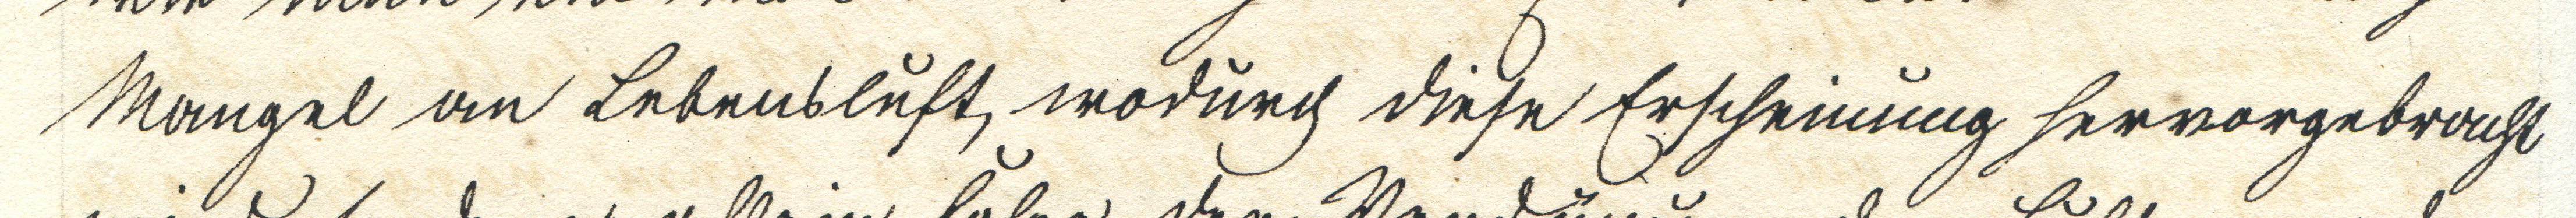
Mangel an Lebensluft, wodurch diese Erscheinung hervorgebracht
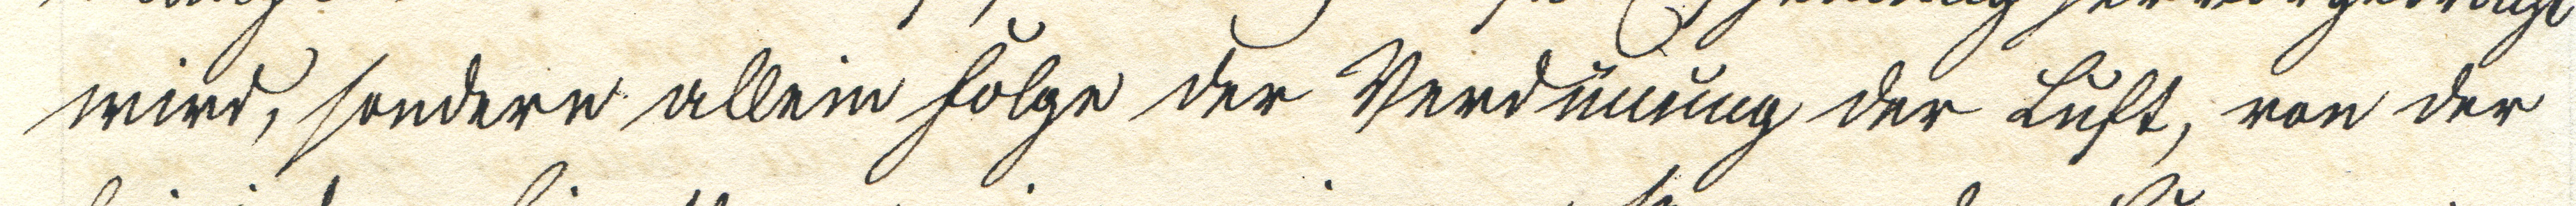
wird, sondern allein Folge der der Luft, von der
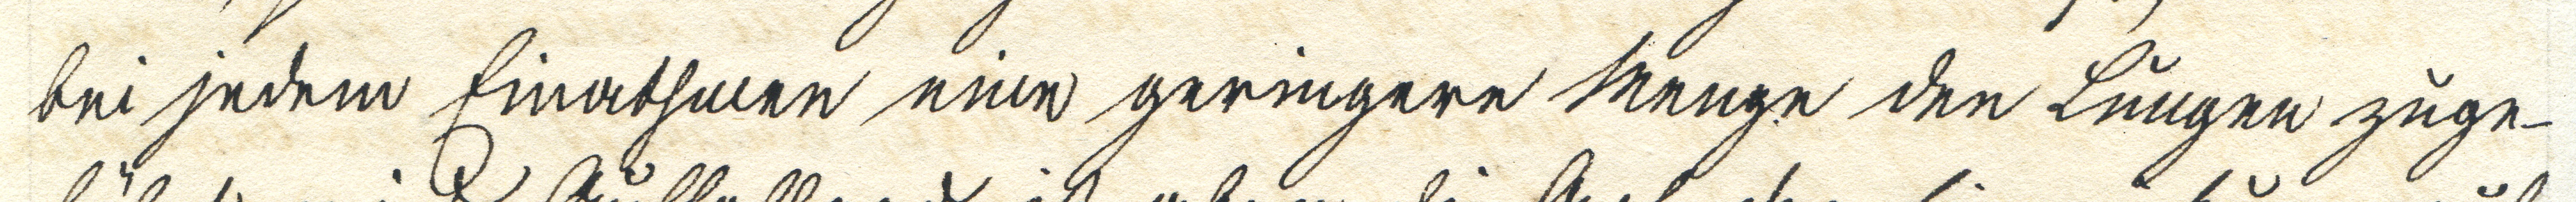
bei jedem Einathmen eine geringere Menge den Lungen zuge-
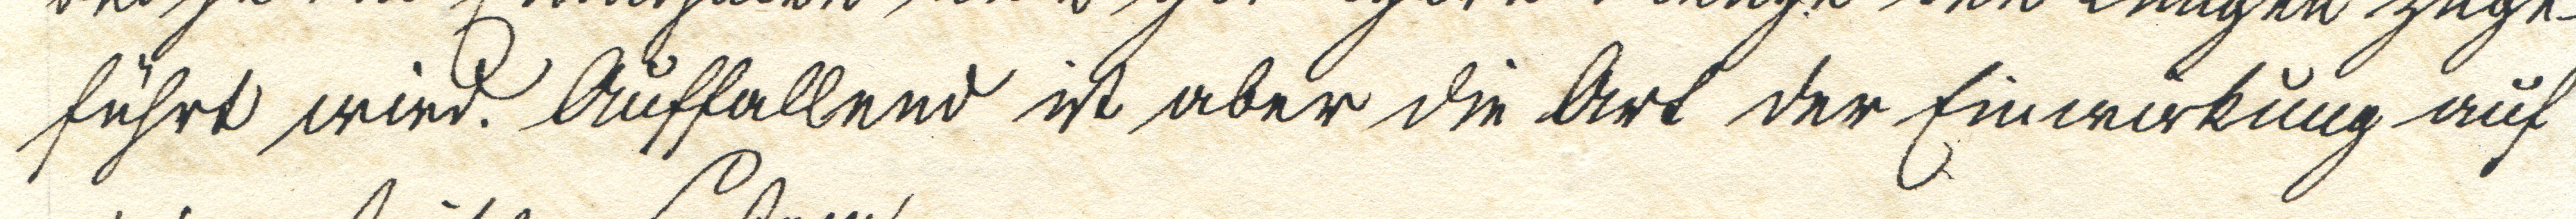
führt wird. Auffallend ist aber die Art der Einwirkung auf
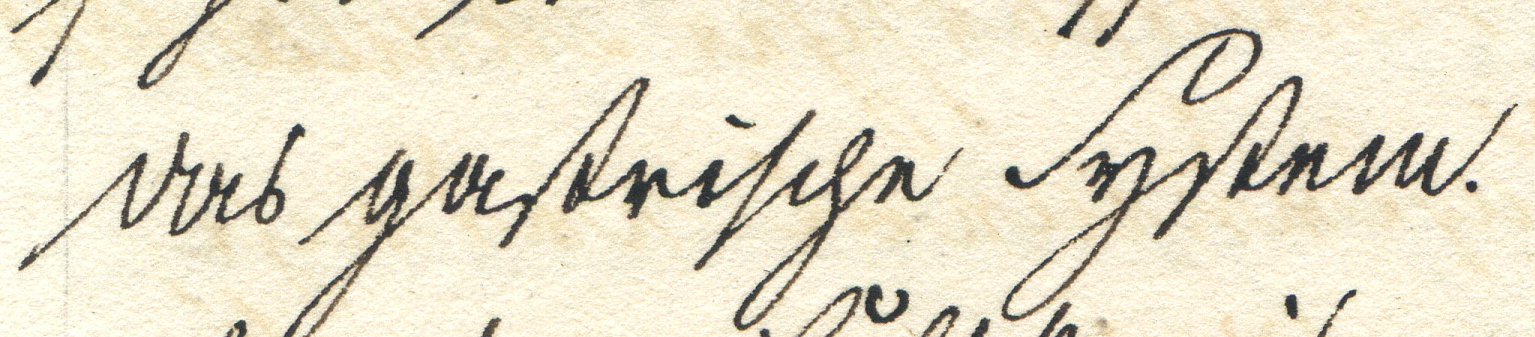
das gastrische System.
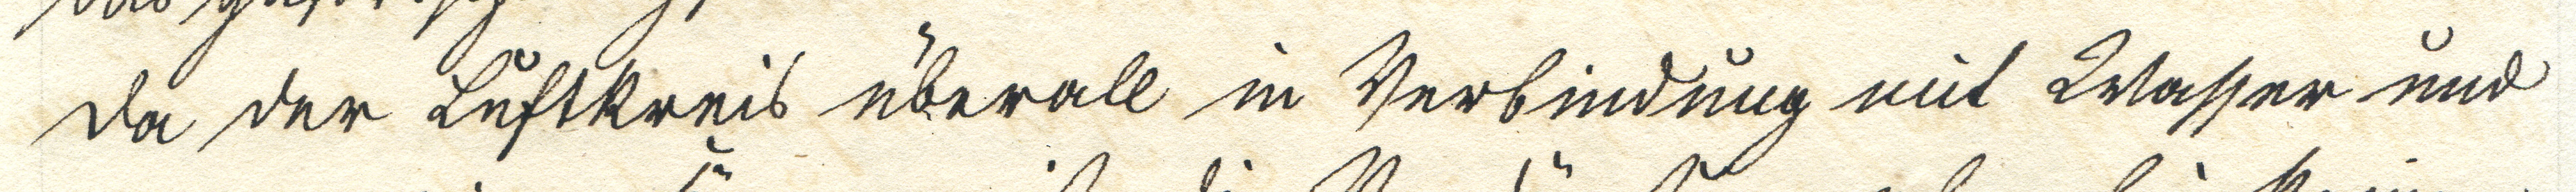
Da der Luftkreis überall in Verbindung mit Wasser und
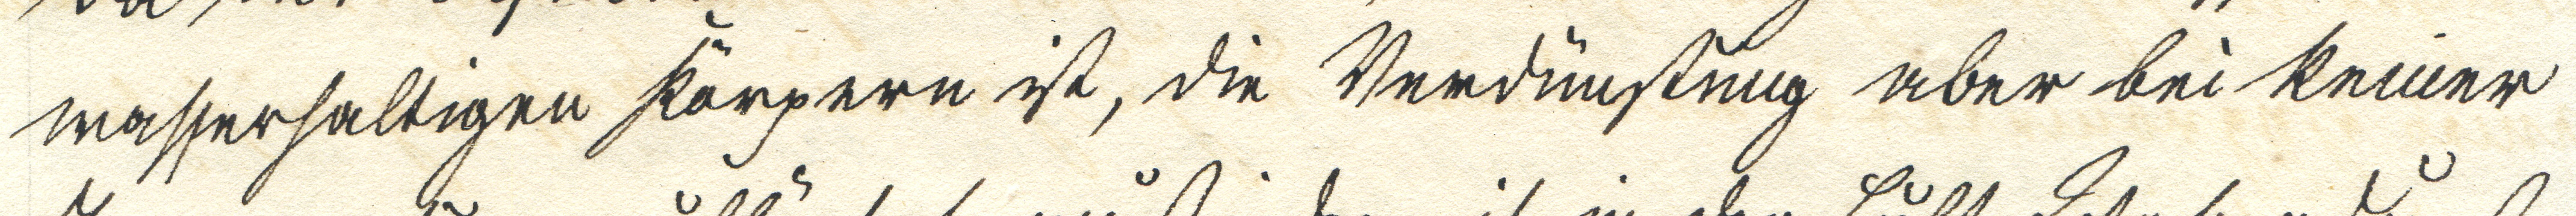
wasserhaltigen Körpern ist, die Verdunstung aber bei keiner
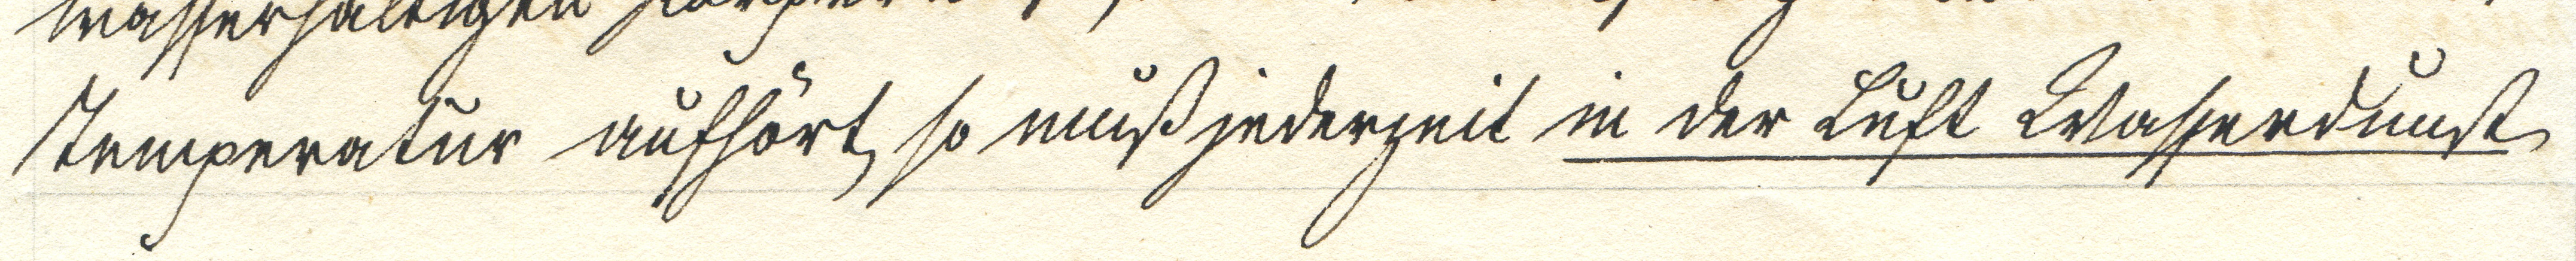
Temperatur aufhört, so muß jederzeit in der Luft Wasserdunst
